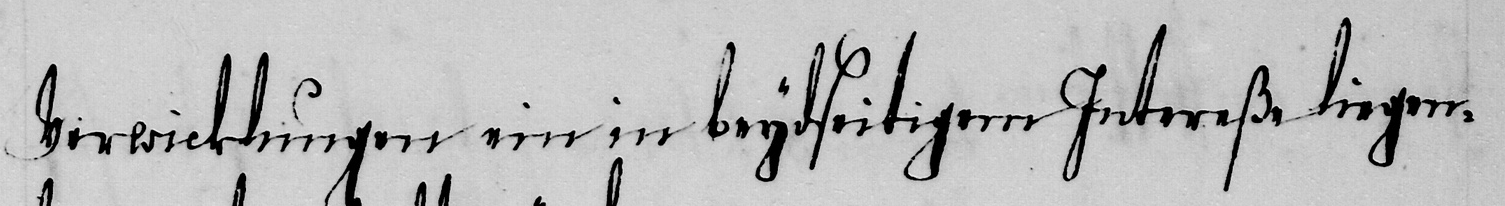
Verwicklungen ein in beydseitigem Intereße liegen¬
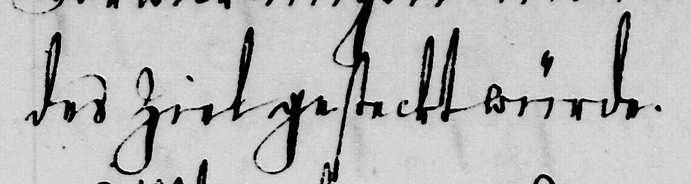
des Ziel gesteckt würde.
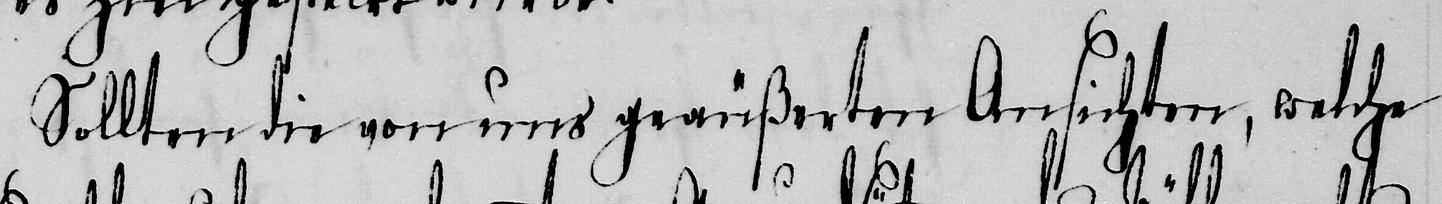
Sollten die von uns geäußerten Ansichten, welche
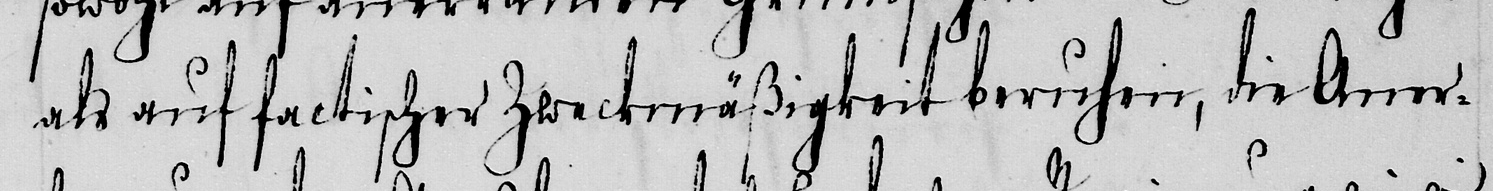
als auf factischer Zweckmäßigkeit beruhen, die Aner¬
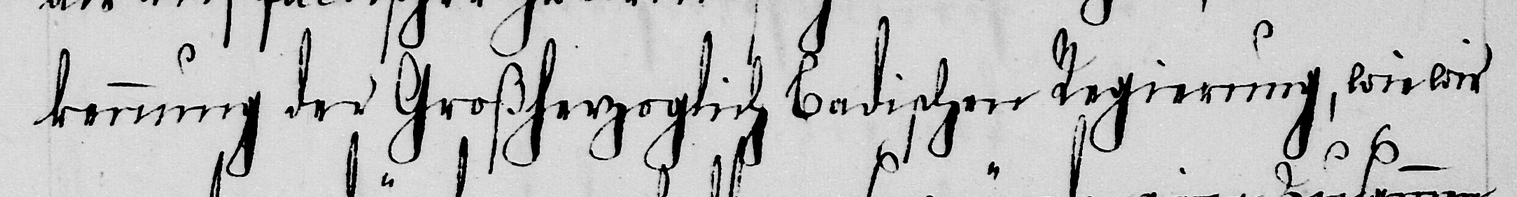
kennung der Großherzoglich Badischen Regierung, wie wir
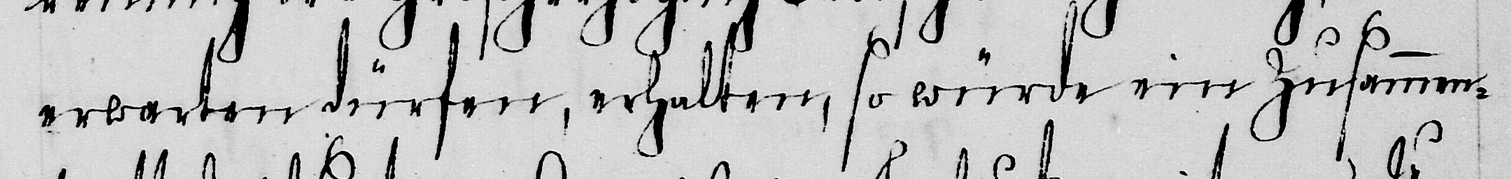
erwarten dürfen, erhalten, so würde ein Zusammen¬
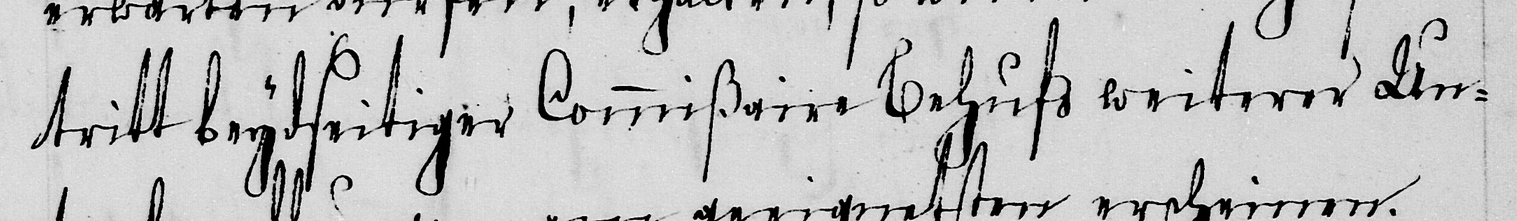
tritt beydseitiger Commißaire Behufs weiterer Un¬
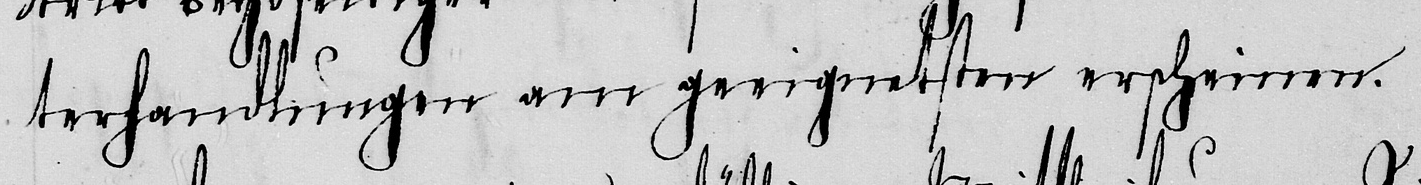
terhandlungen am geeignetsten erscheinen.
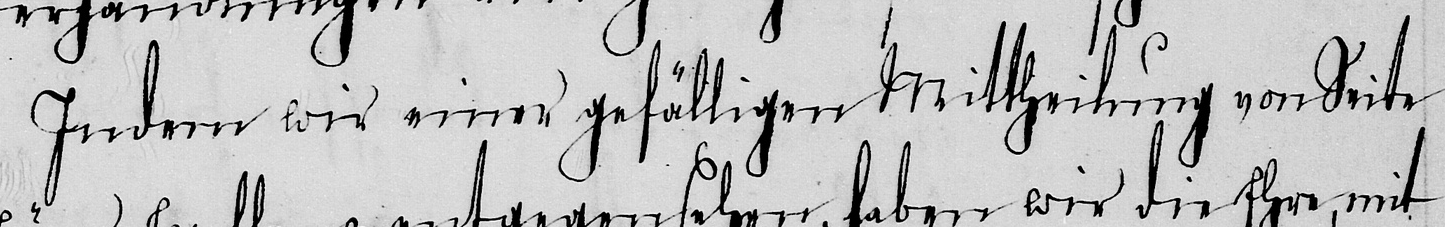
Indem wir einer gefälligen Mittheilung von Seite
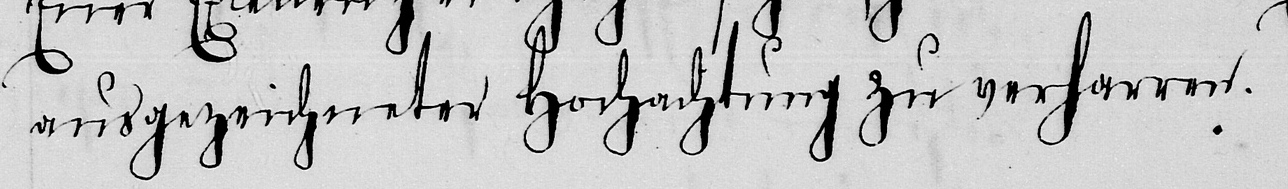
ausgezeichneter Hochachtung zu verharren.
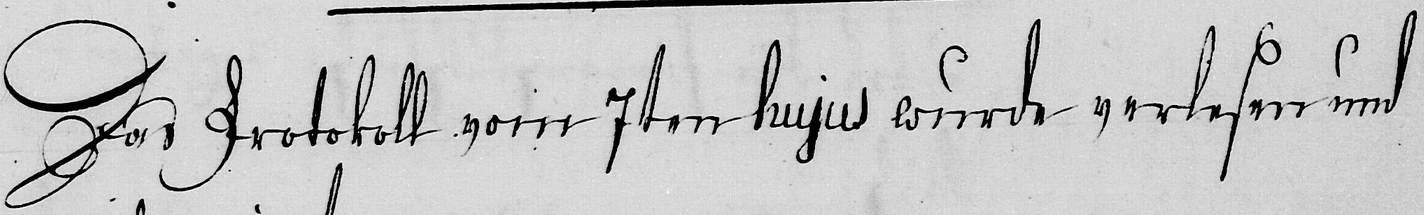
Das Protokoll vom 7ten hujus wurde verlesen und
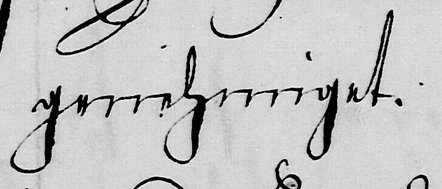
genehmigt.
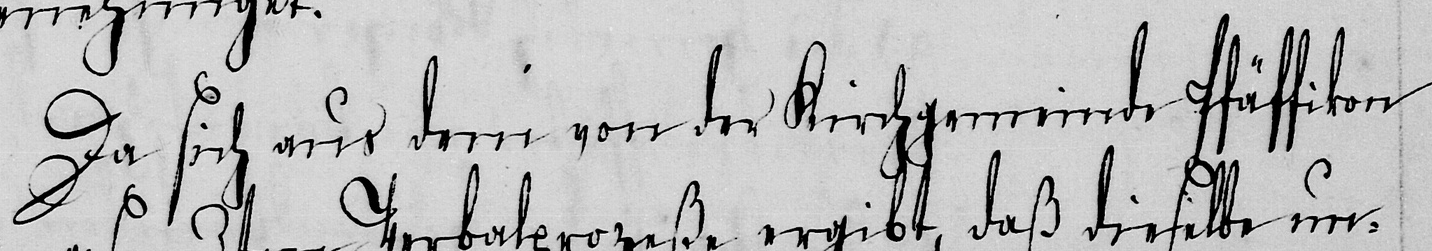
Da sich aus dem von der Kirchgemeinde Pfäffikon
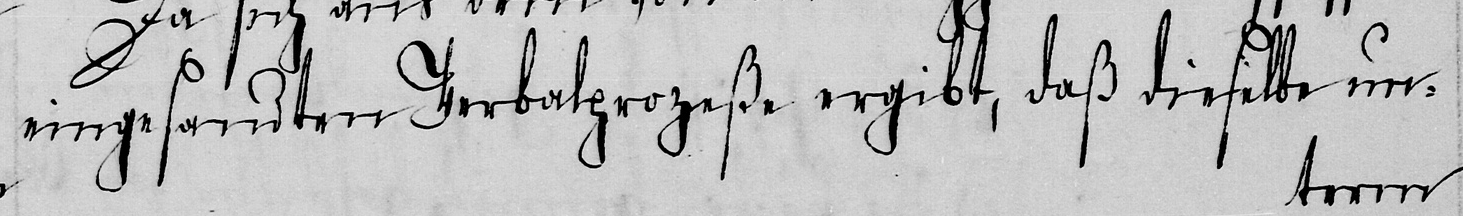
eingesandten Verbalprozeße ergibt, daß dieselbe un-
